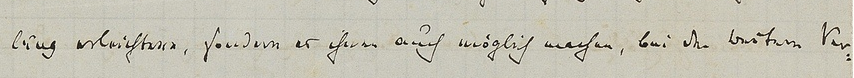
lung erleichtern, sondern es ihnen auch möglich machen, bei der weitern Ver-
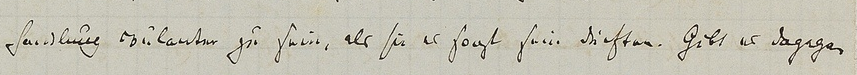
handlung coulanter zu sein, als sie es sonst sein dürften. Gibt es dagegen
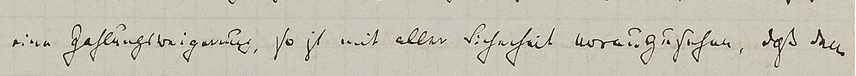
eine Zahlungsweigerung, so ist mit aller Sicherheit vorauszusehen, daß dem
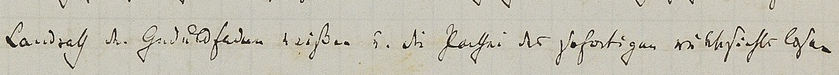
Landrath der Geduldfaden reißen u. die Parthei des sofortigen rükksichtslosen
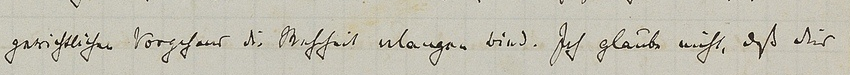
gerichtlichen Vorgehens die Mehrheit erlangen wird. Ich glaube nicht, daß dies
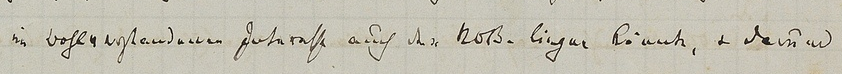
im wohlverstandenen Interesse auch der NOB. liegen könnte, & darum
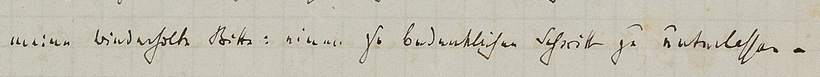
meine wiederholte Bitte: einen so bedenklichen Schritt zu unterlassen –
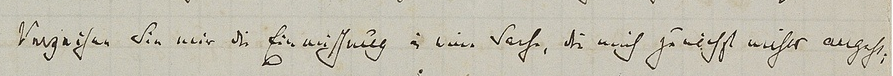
Verzeihen Sie mir die Einmischung in eine Sache, die mich zunächst nichts angeht;
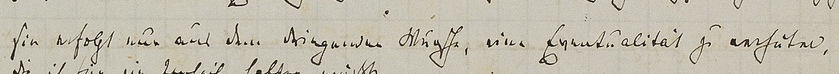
sie erfolgt nur aus dem dringenden Wunsche, eine Eventualität zu verhüten,
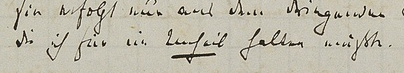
die ich für ein Unheil halten müßte.
